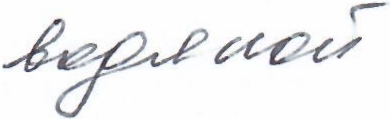водяной
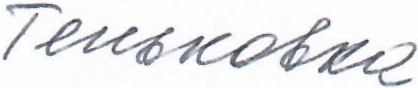теньковка
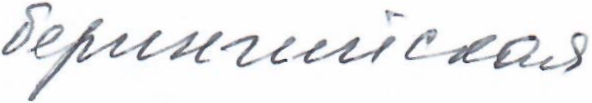берингийская
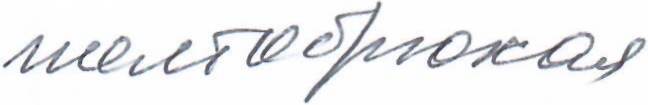желтобрюхая
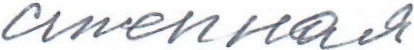степная
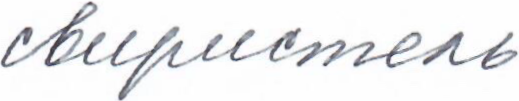свиристель
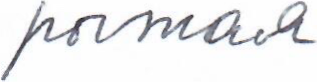рыжая
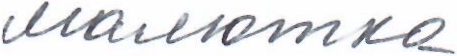малютка
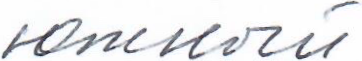южный
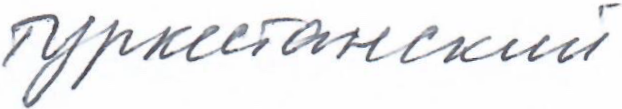туркестанский
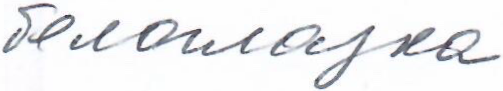белоглазка
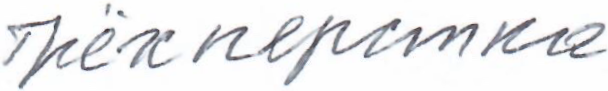трёхперстка
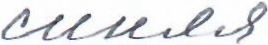синяя
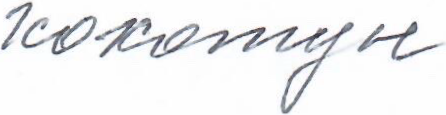хохотун
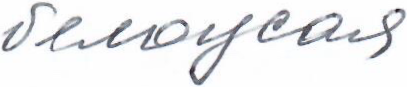белоусая
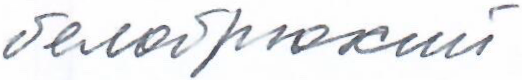белобрюхий
